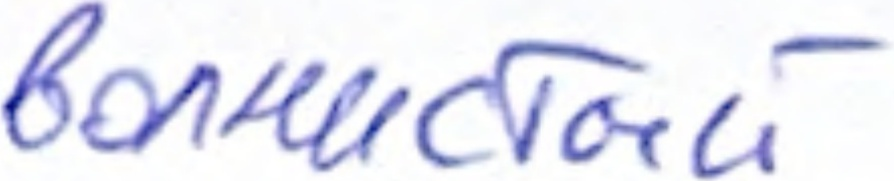волнистый
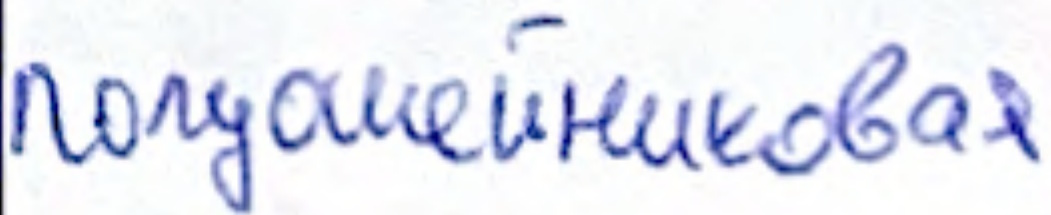полуошейниковая
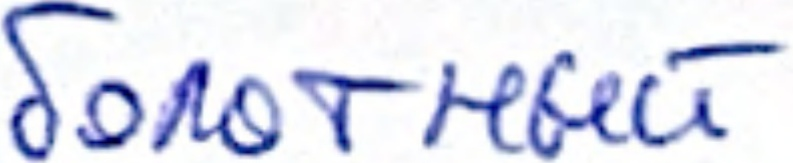болотный
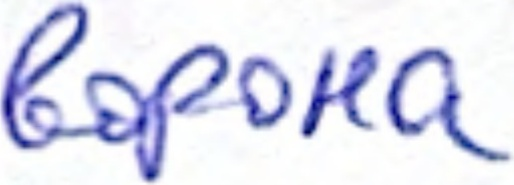ворона
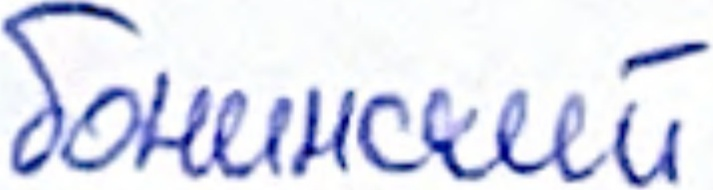бонинский
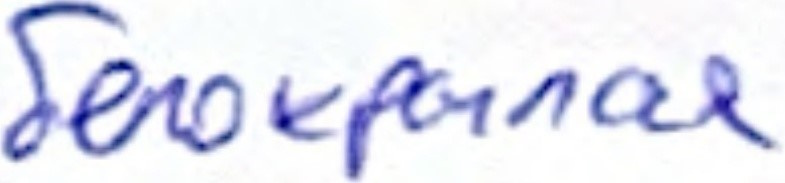белокрылая
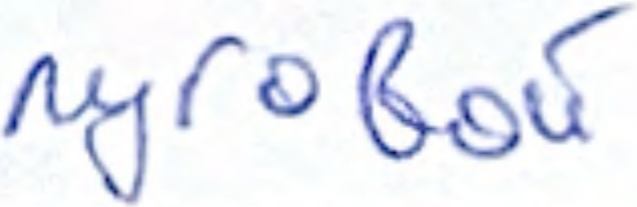луговой
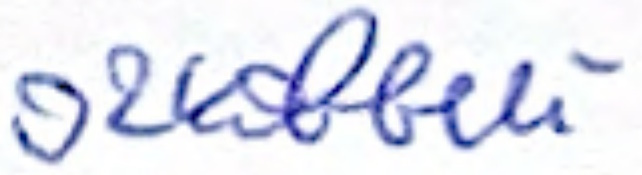очковый
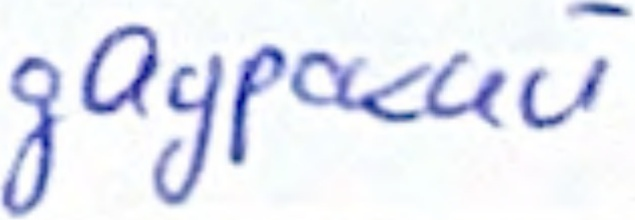даурский
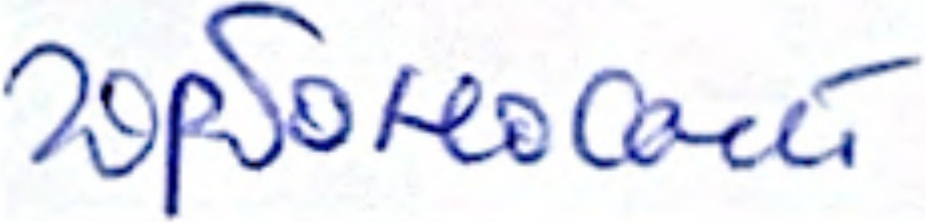горбоносый
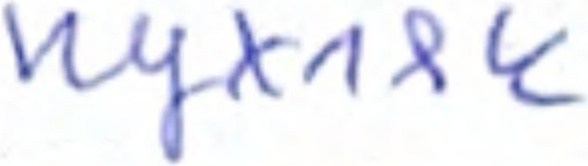пухляк
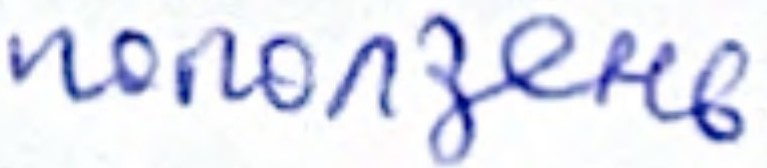поползень
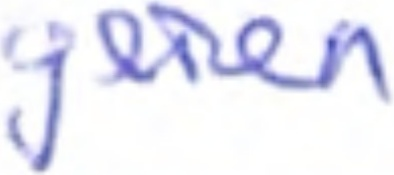дятел
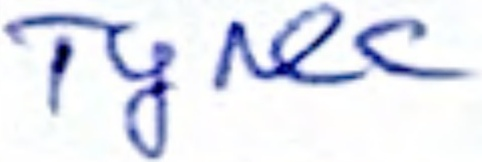тулес
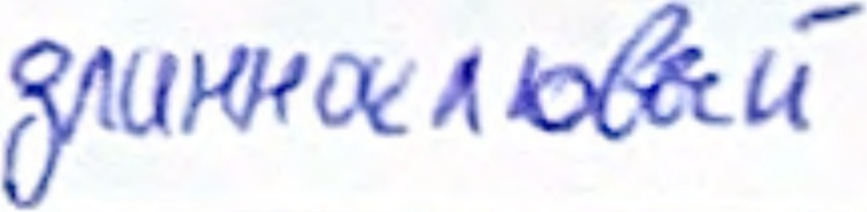длинноклювый
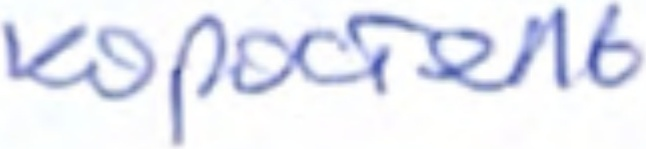коростель
